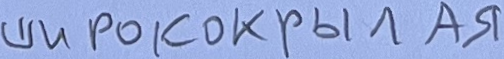ширококрылая
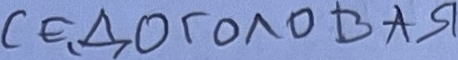седоголовая
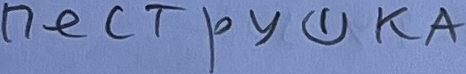пеструшка
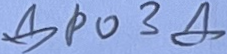дрозд
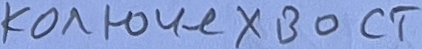колючехвост
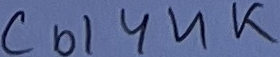сычик
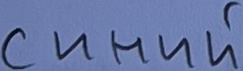синий
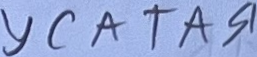усатая
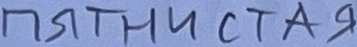пятнистая
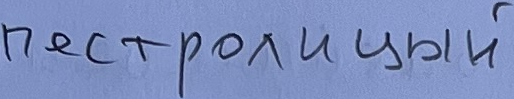пестролицый
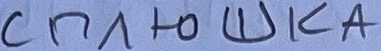сплюшка
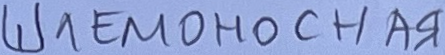шлемоносная
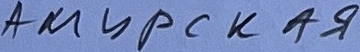амурская
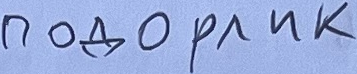подорлик
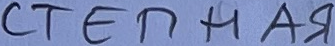степная
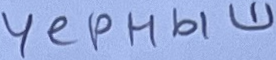черныш
